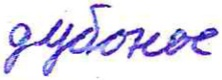дубонос
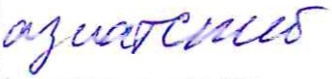азиатский
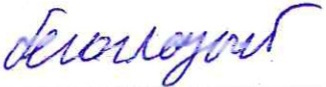белоглозый
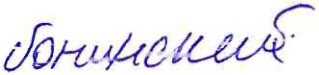бонинский
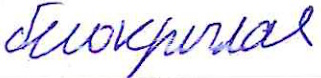белокрылая
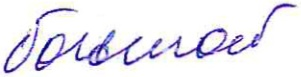большой
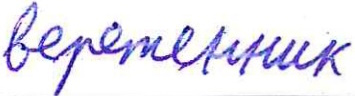веретенник
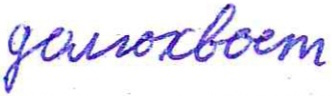долгохвост
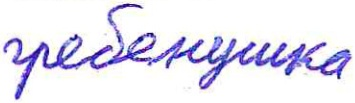гребенушка
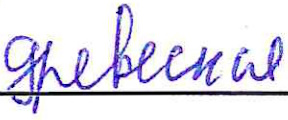древесная
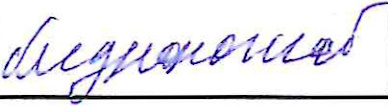бледноногий
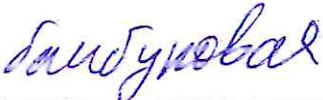бамбуковая
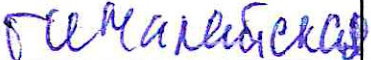гималайская
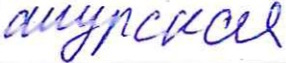амурская
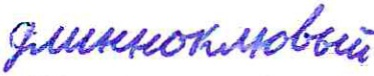длинноклювый
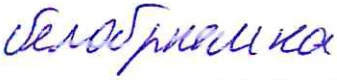белобрношка
